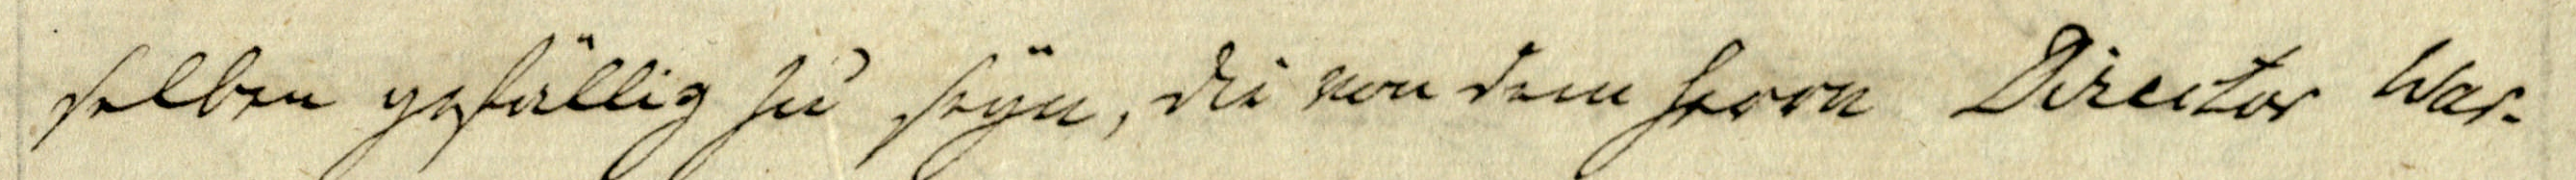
selben gefällig zu seÿn, die von dem herrn Director War¬
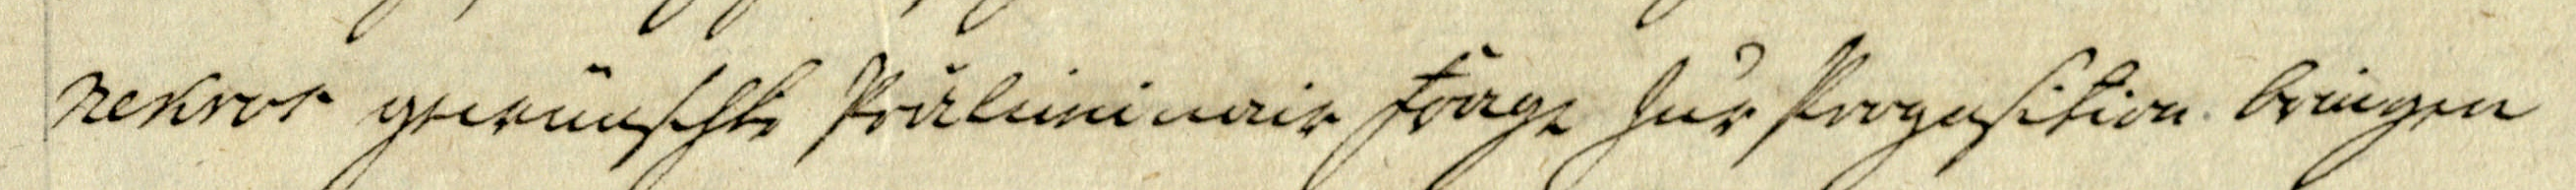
nekros gewünschte Präliminair Frage zur Proposition bringen
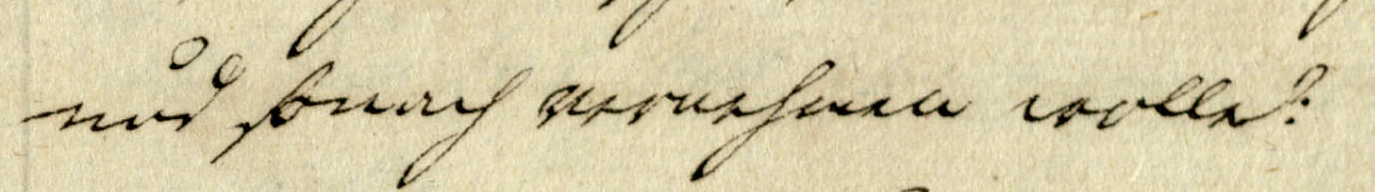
und sonach vernehmen wolle:
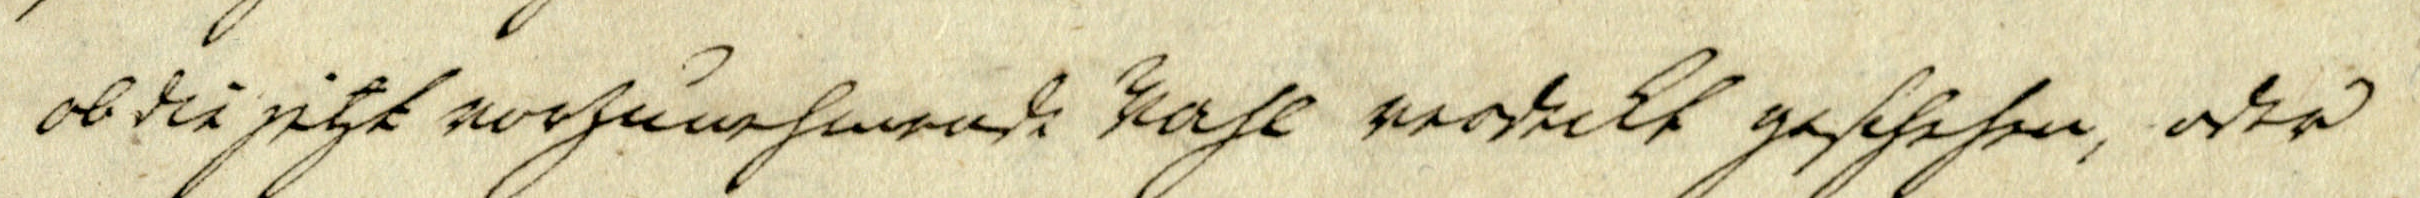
ob die jetzt vorzunehmende Wahl verdeckt geschehen, oder
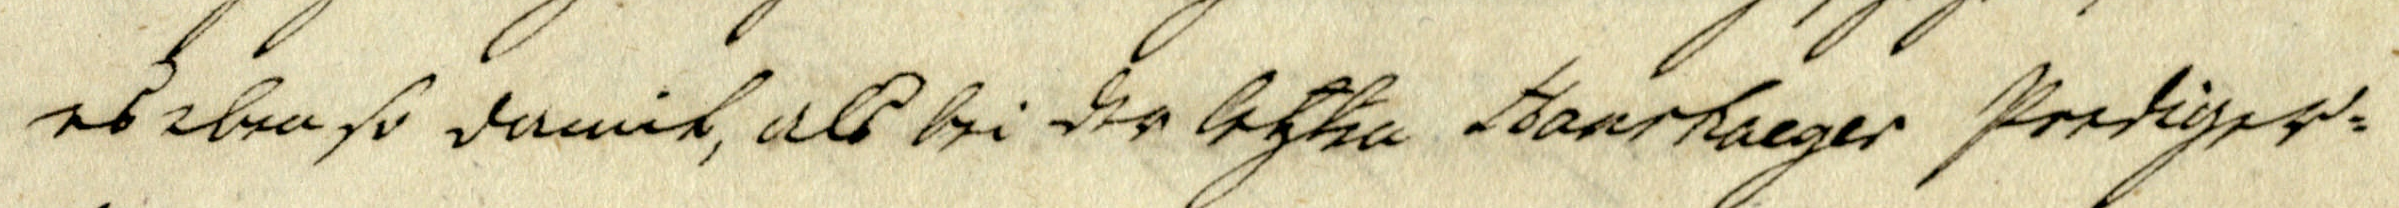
es eben so damit, als bei der letzten Hanshaeger Prediger¬
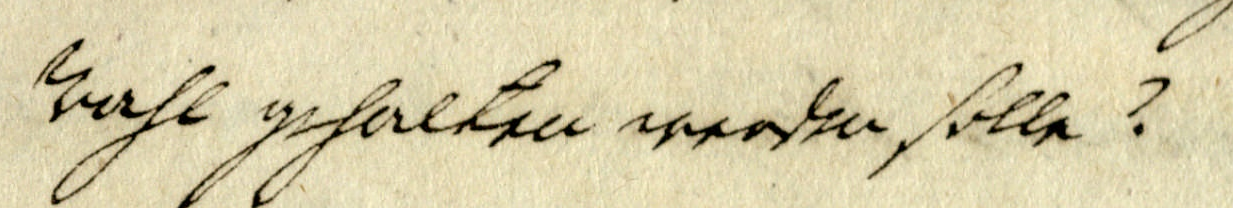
Wahl gehalten werden solle?
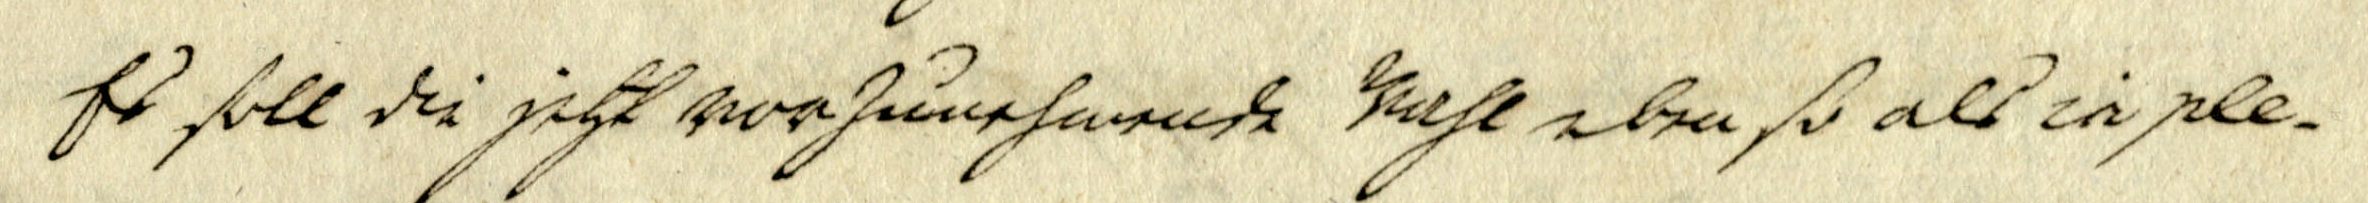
Es soll die jetzt vorzunehmende Wahl eben so als in ple¬
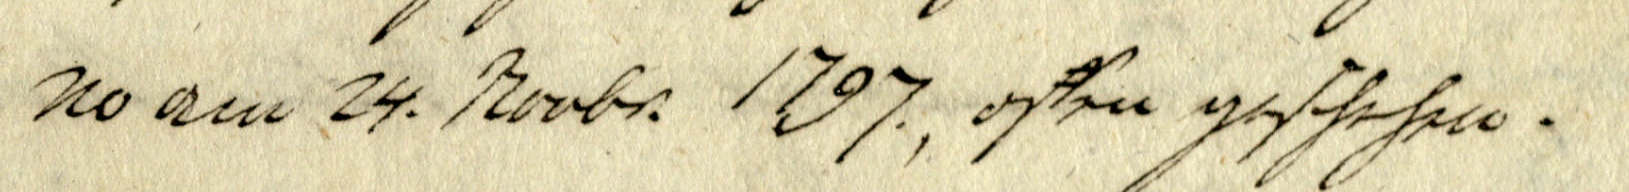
no am 24. Novbr. 1797., offen geschehen.
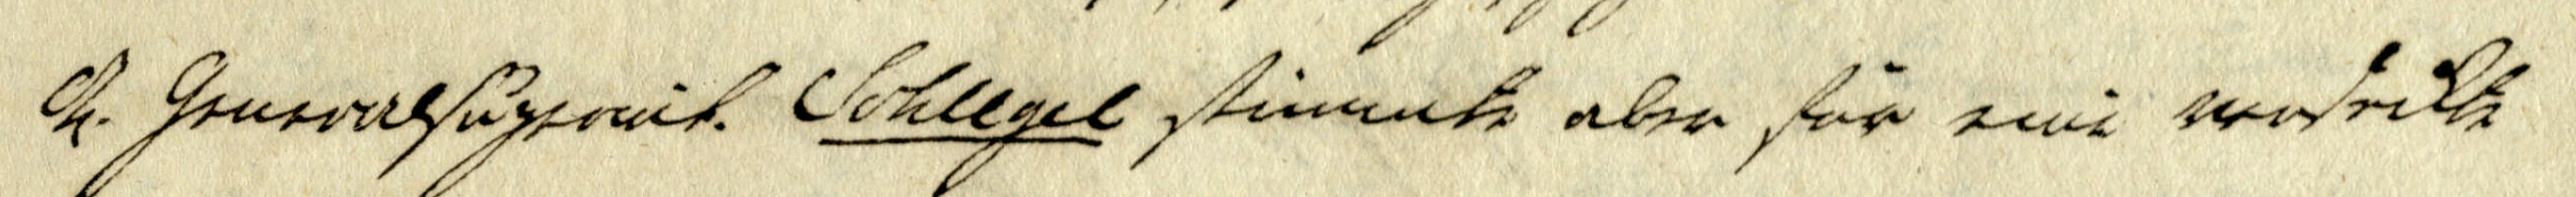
dh. Generalsuperint. Schlegel stimmte aber für eine verdeckte
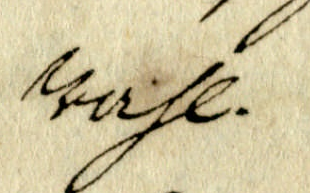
Wahl.
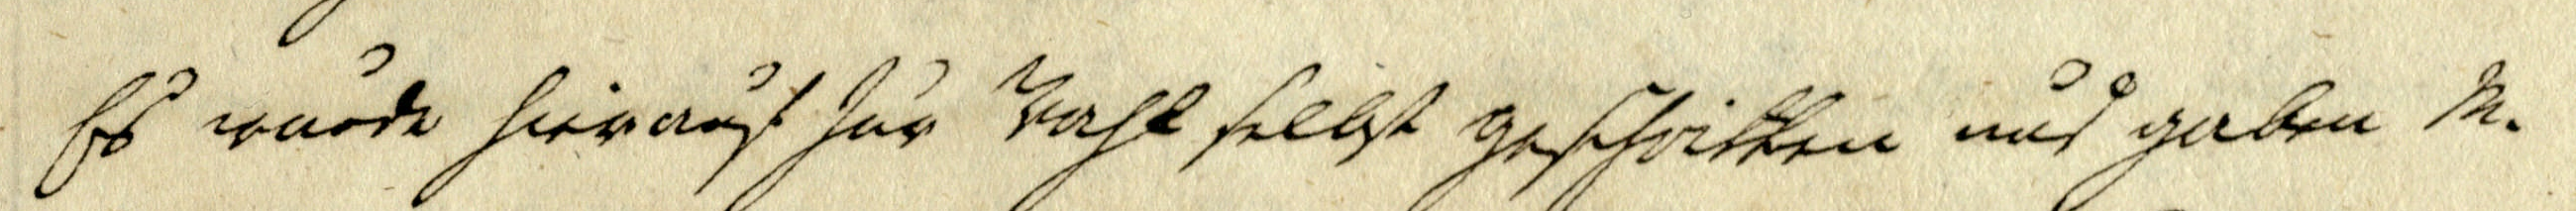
Es wurde hierauf zur Wahl selbst geschritten und gaben M.
